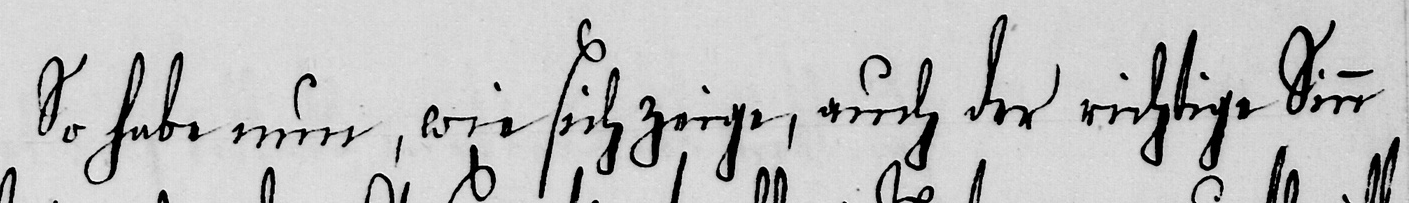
So habe nun, wie sich zeige, auch der richtige Sinn
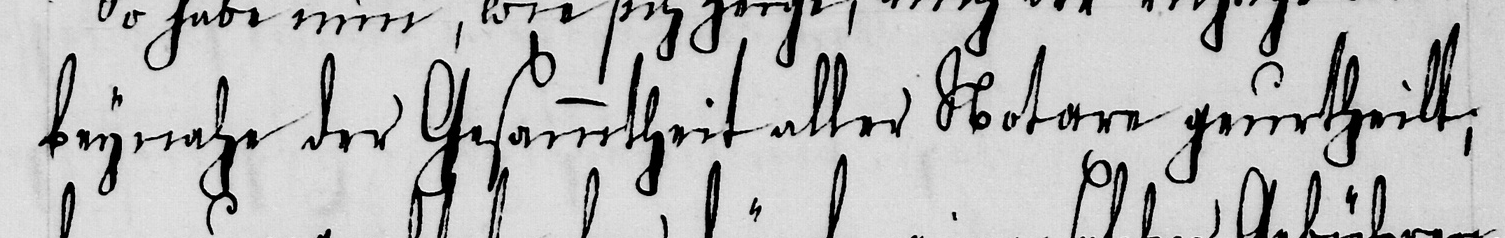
beynahe der Gesammtheit aller Notare geurtheilt,
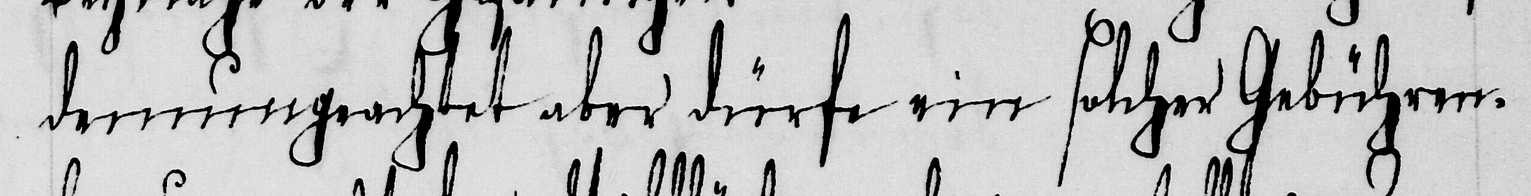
demungeachtet aber dürfe ein solcher Gebühren¬
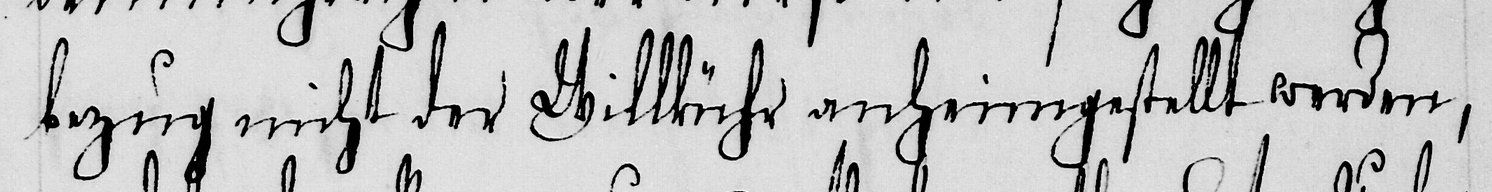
bezug nicht der Willkühr anheimgestellt werden,
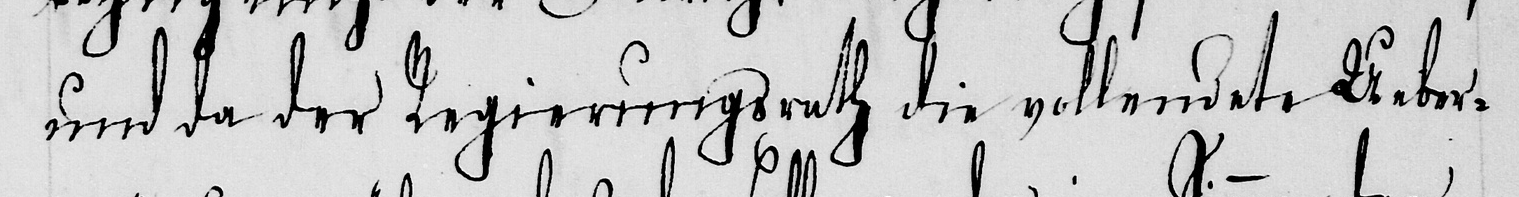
und da der Regierungsrath die vollendete Ueber¬
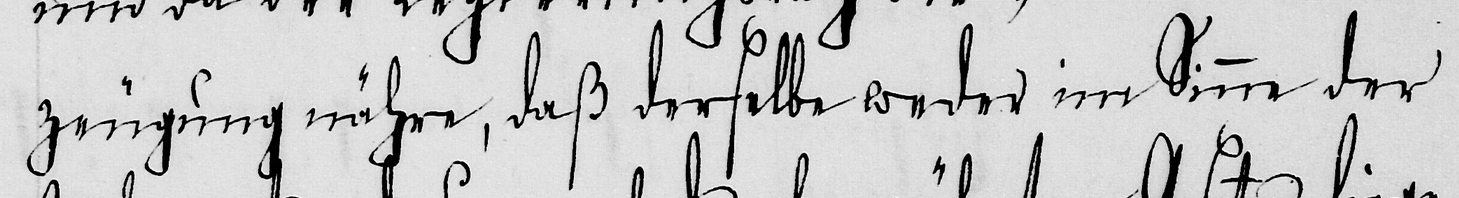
zeugung nähre, daß derselbe weder im Sinne der
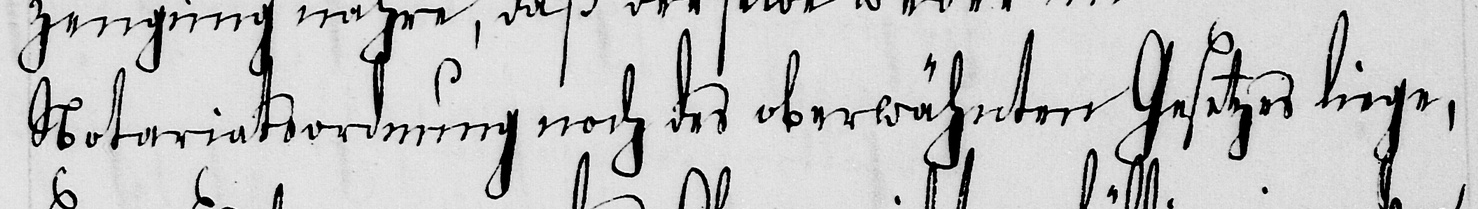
Notariatsordnung noch des oberwähnten Gesetzes liege,
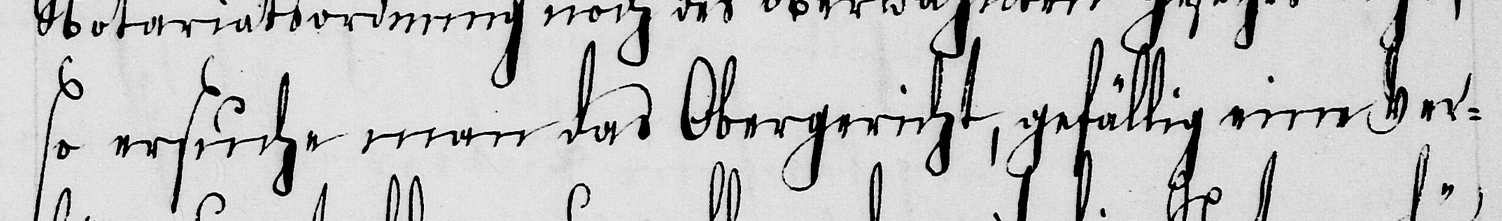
so ersuche man das Obergericht, gefällig eine Ver¬
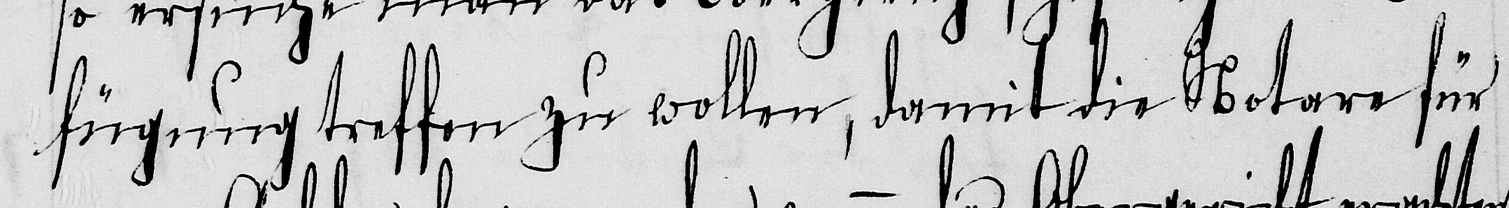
fügung treffen zu wollen, damit die Notare für
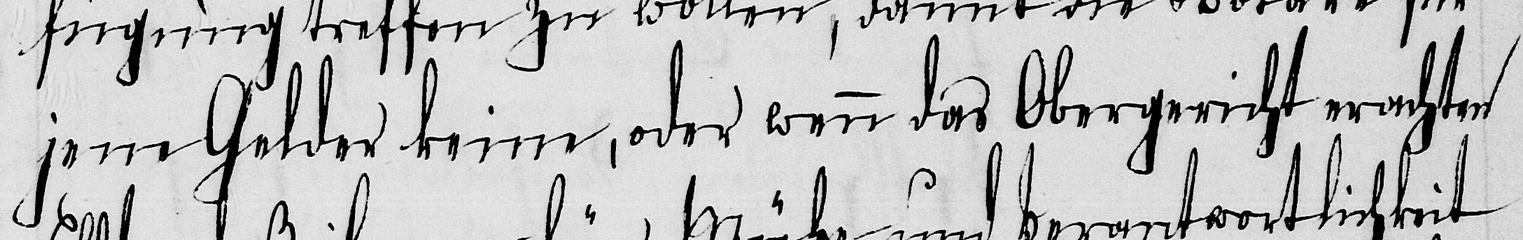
jene Gelder keine, oder wenn das Obergericht erachten
